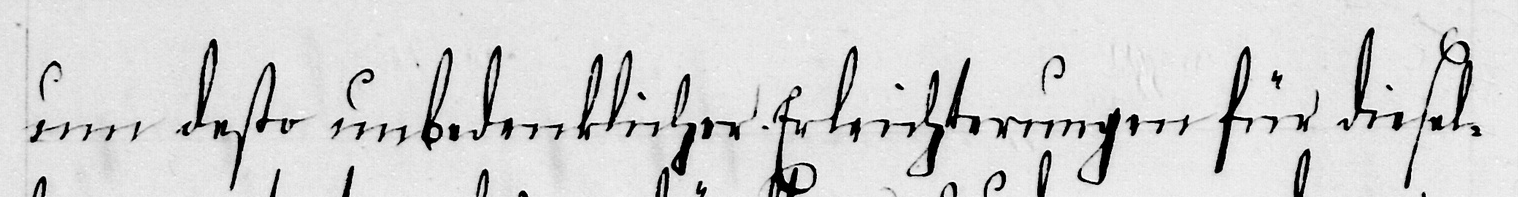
um desto unbedenklicher Erleichterungen für diesel¬
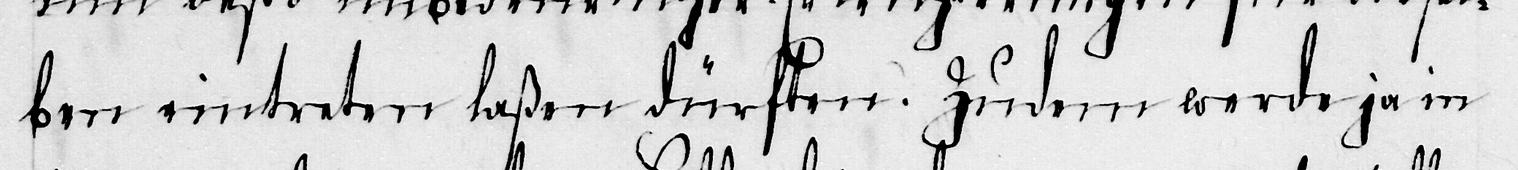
ben eintreten laßen dürften. Zudem werde ja in
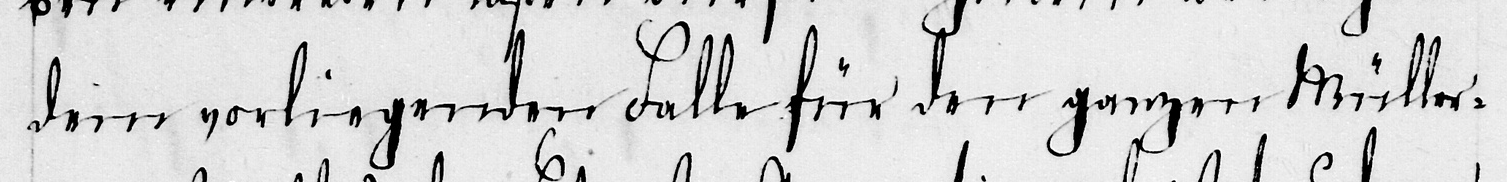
dem vorliegenden Falle für den ganzen Müller¬
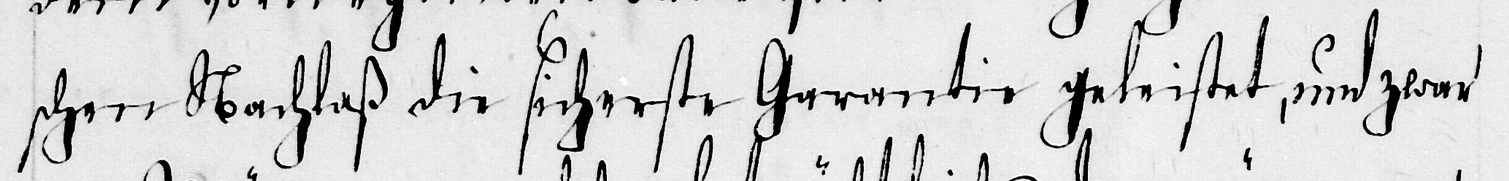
schen Nachlaß die sicherste Garantie geleistet, und zwar
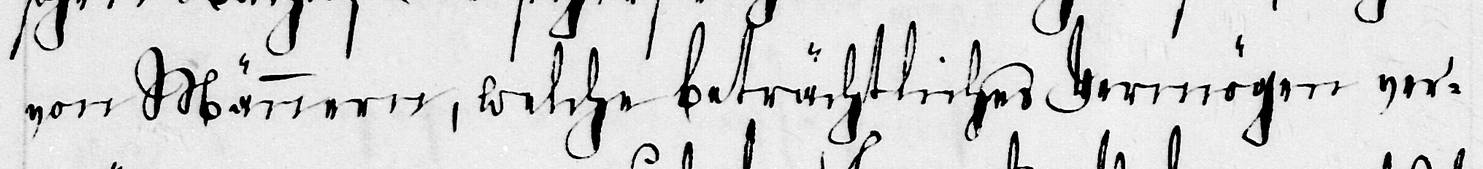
von Männern, welche beträchtliches Vermögen ver¬
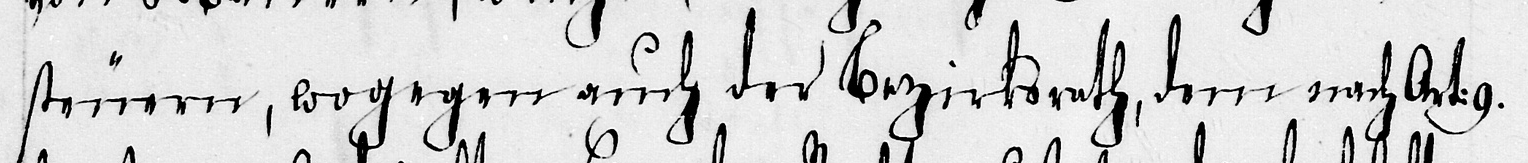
steuern, wogegen auch der Bezirksrath, dem nach Art:
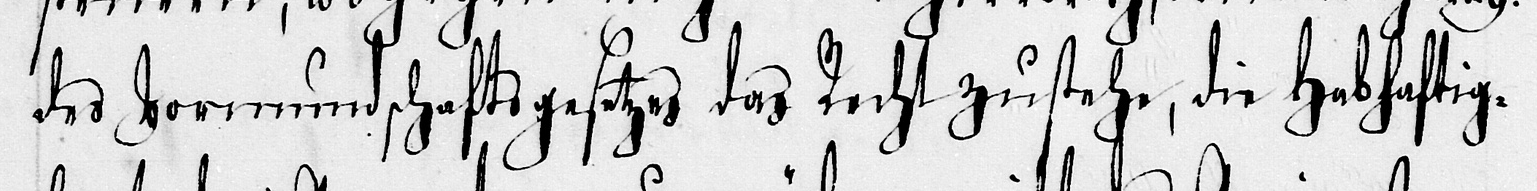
des Vormundschaftsgesetzes das Recht zustehe, die Habhaftig¬
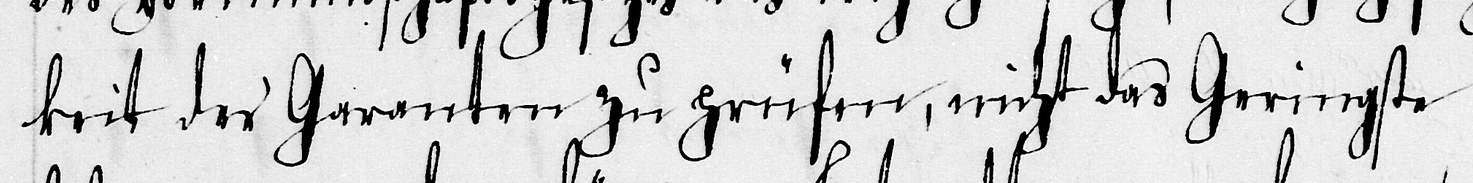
keit der Garanten zu prüfen, nicht das Geringste
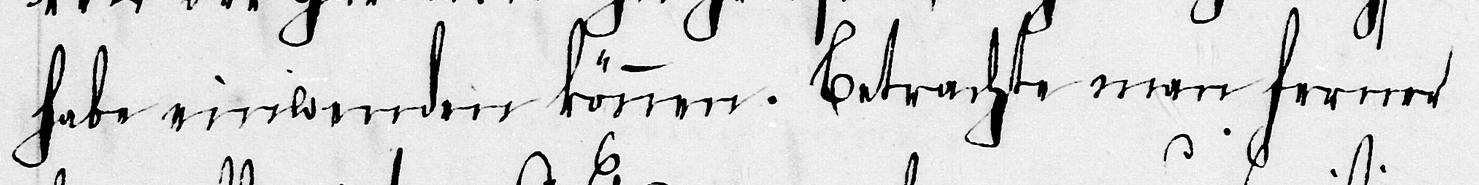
habe einwenden können. Betrachte man ferner
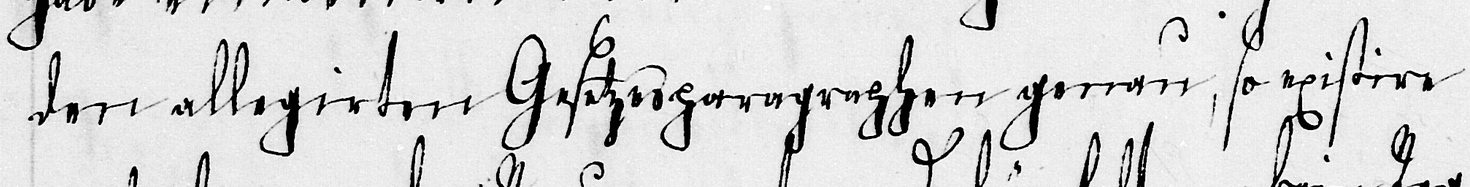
den allegirten Gesetzesparagraphen genau, so existire
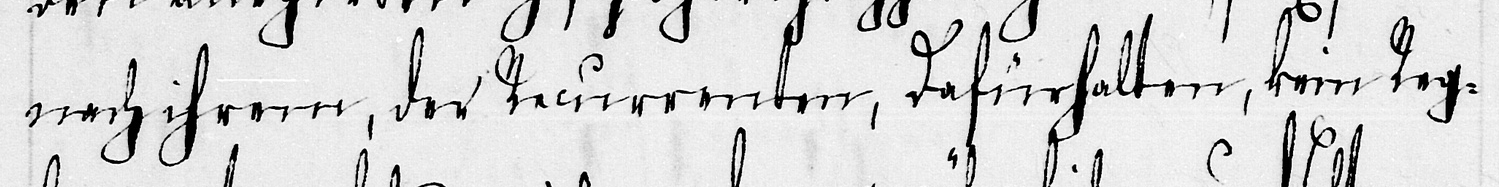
nach ihrem, der Recurrenten, Dafürhalten, kein Reg¬
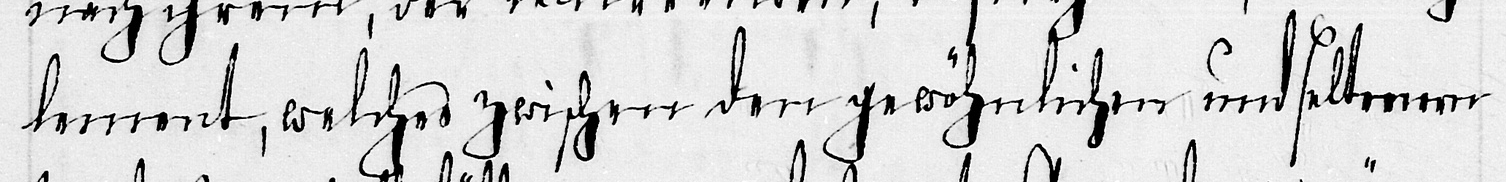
lement, welches zwischen den gewöhnlichen und seltenern
